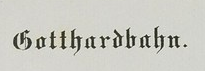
Gotthardbahn.
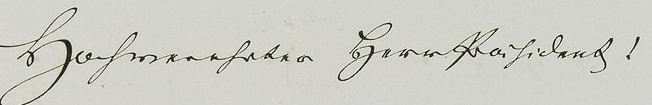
Hochverehrter Herr Präsident!
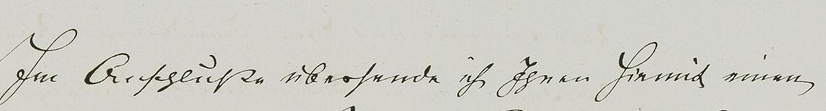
Im Anschluße übersende ich Ihnen hiemit einen
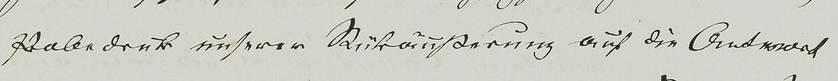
Probedruk unserer Rükäußerung auf die Antwort
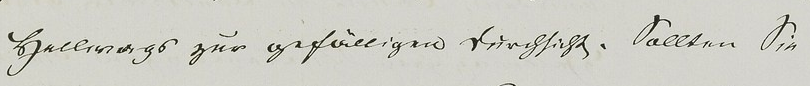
Hellwags zur gefälligen Durchsicht. Sollten Sie
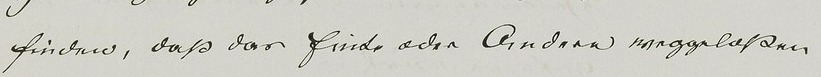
finden, daß das Einte oder Andere weggelaßen
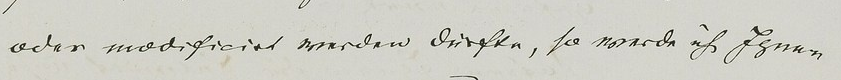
oder modificirt werden dürfte, so werde ich Ihnen
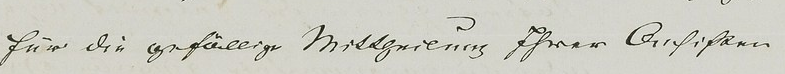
für die gefällige Mittheilung Ihrer Ansichten
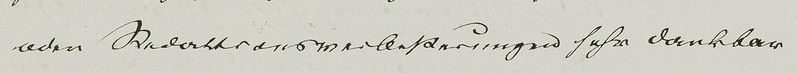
oder Redaktionsverbeßerungen sehr dankbar
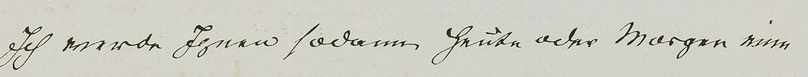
Ich werde Ihnen sodann heute oder Morgen eine
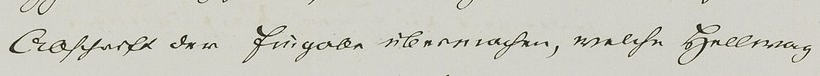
Abschrift der Eingabe übermachen, welche Hellwag
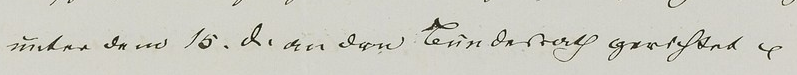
unter dem 15. d. an den Bundesrath gerichtet &
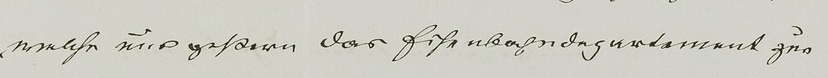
welche uns gestern das Eisenbahndepartement zur
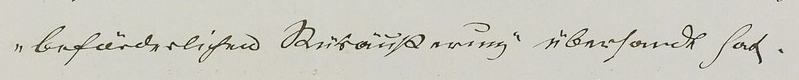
«beförderliche Rükäußerung» übersandt hat.
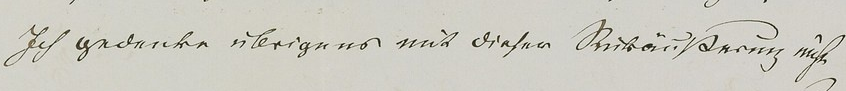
Ich gedenke übrigens mit dieser Rükäußerung nicht
